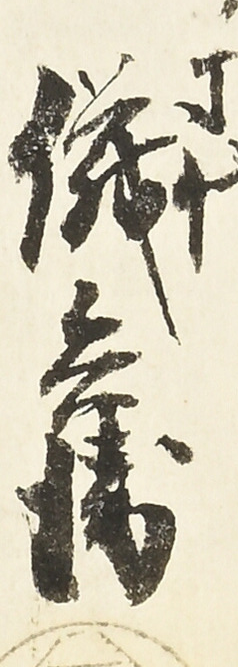申儀兵衛
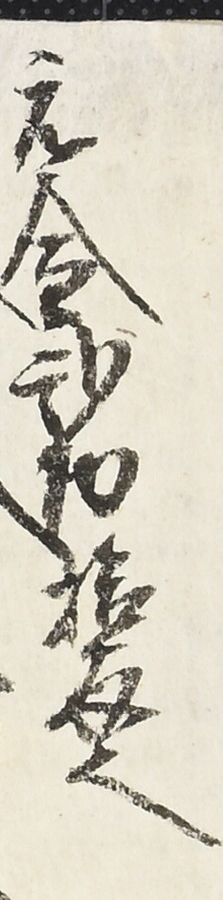元金弐百拾両也
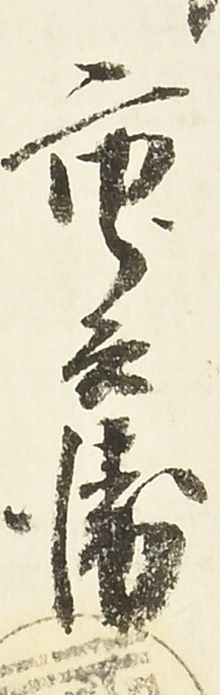市郎兵衛
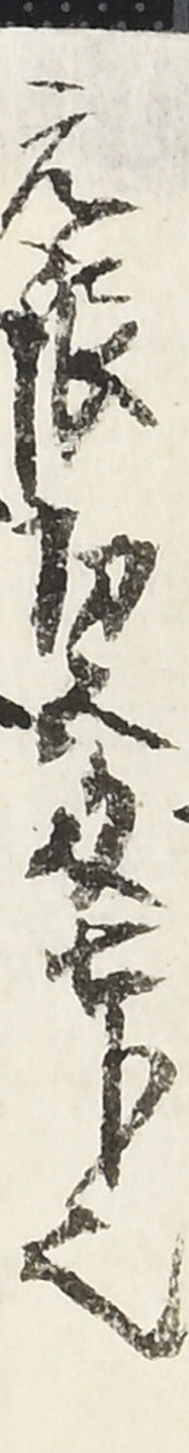元銀拾五匁七分也
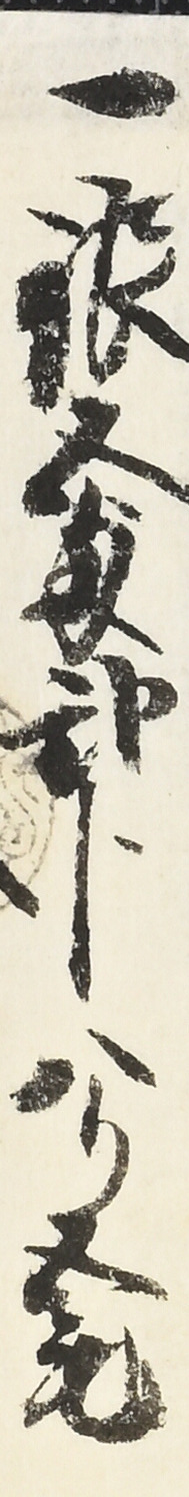一銀五匁弐分八厘五毛
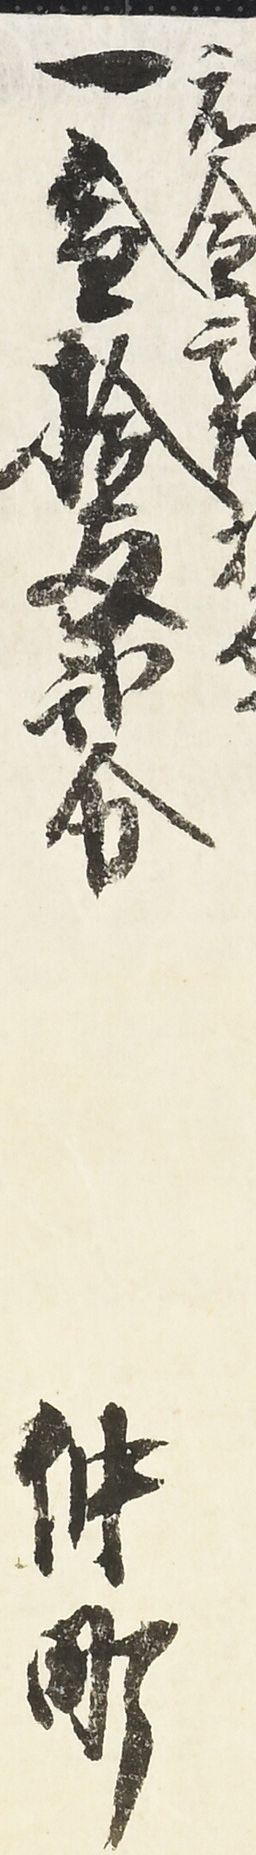一金拾両弐分仲町
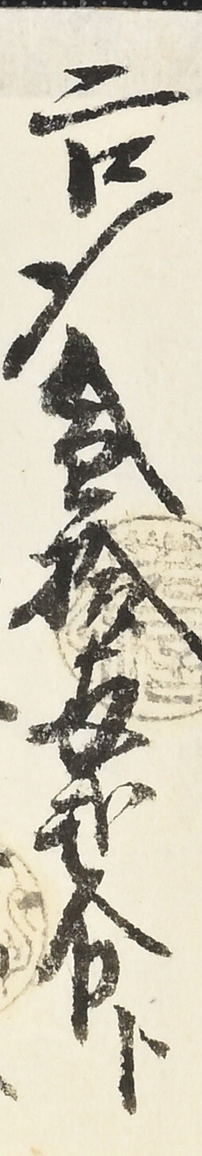二口〆金拾両弐分ト
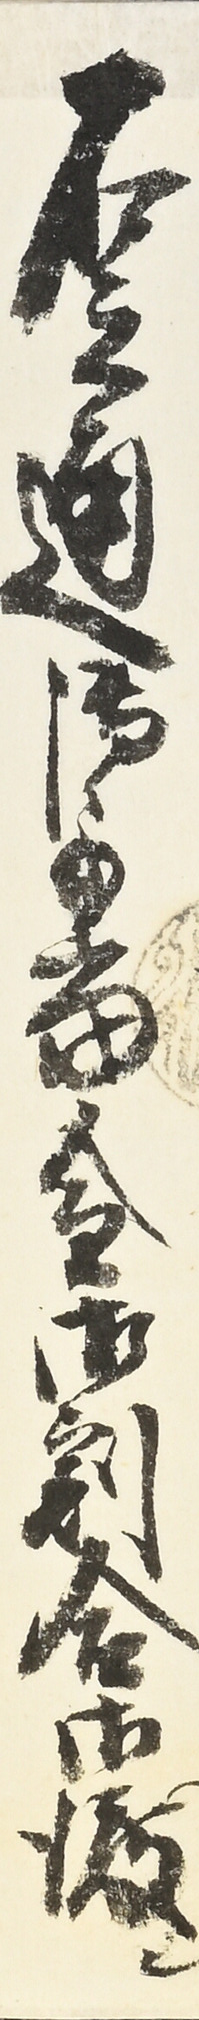右之通御手当金御割合御渡し
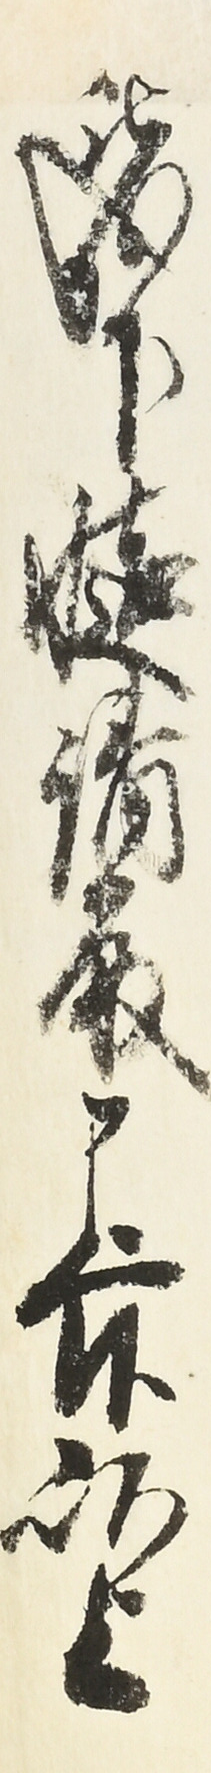被成下慥請取申上候以上
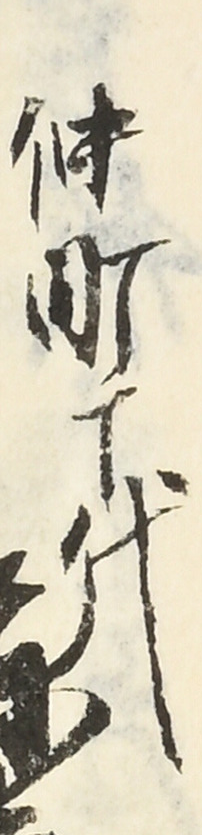本町丁代
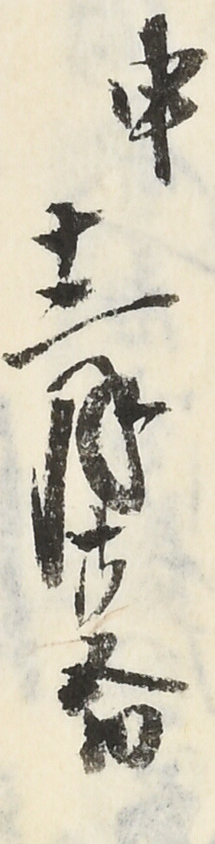申十二月廿四日
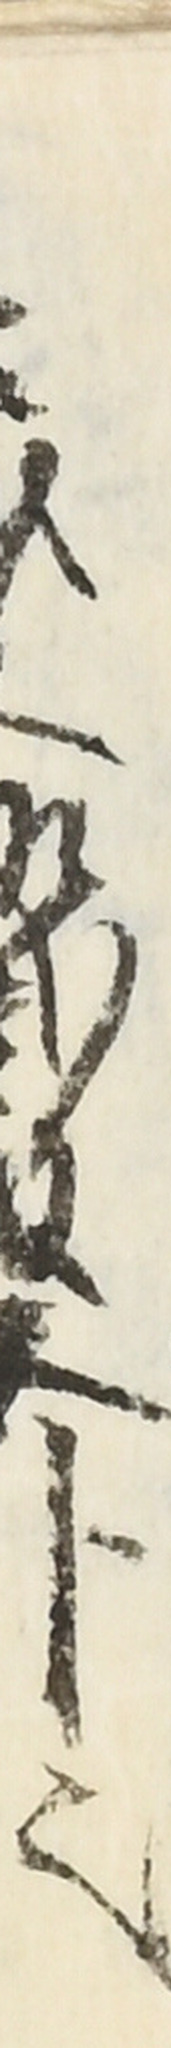元銀三拾壱匁三分也

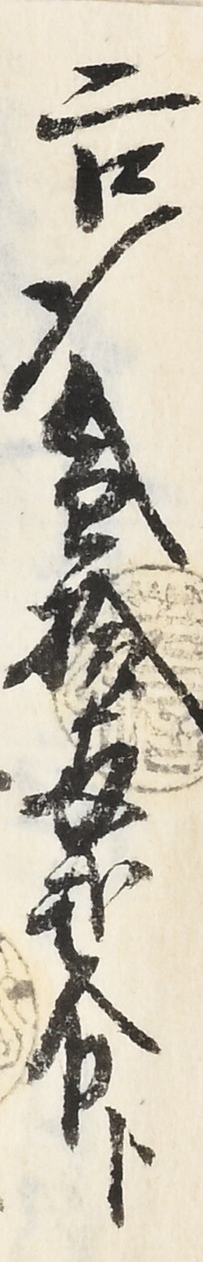二口〆金四両三分ト
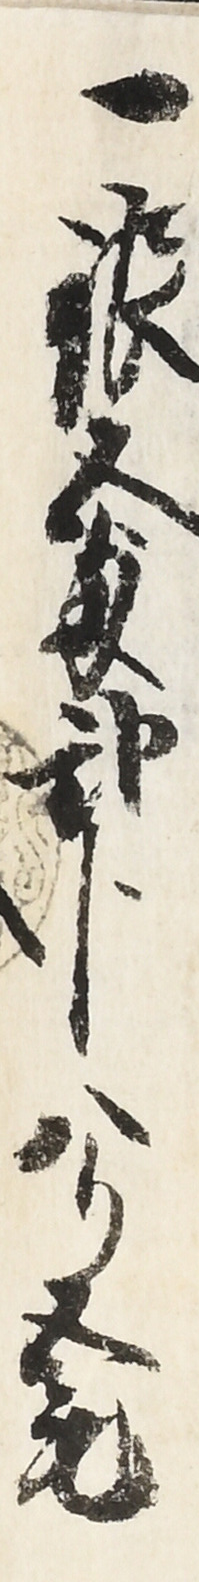一銀弐匁六分弐厘五毛
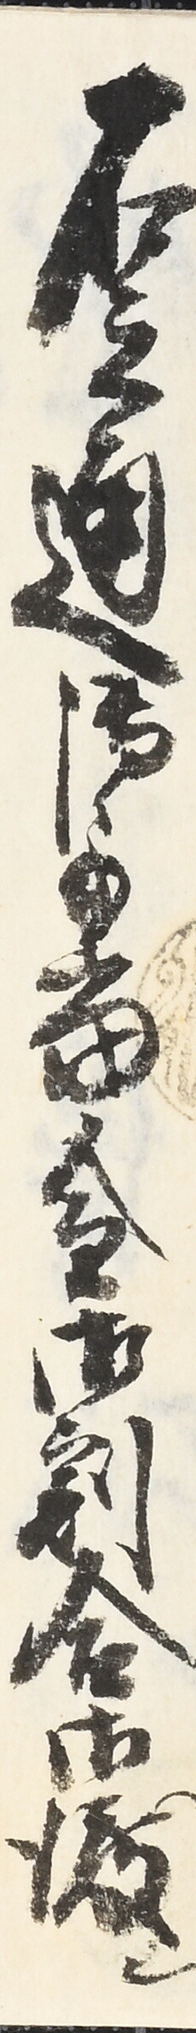右之通御手当金御割合御渡し
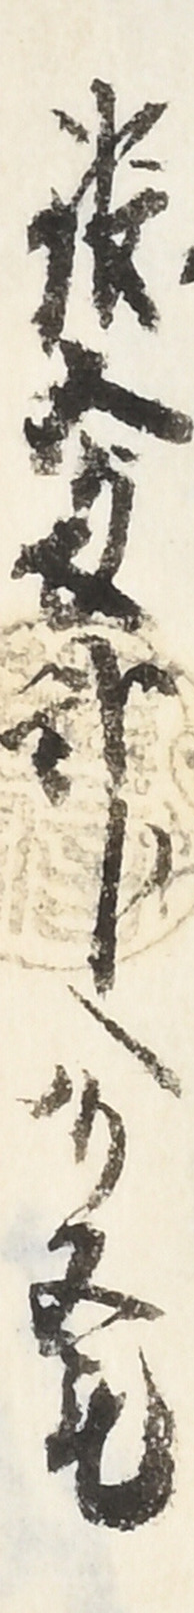銀五匁五分弐厘五毛
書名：御才覚金御利足割渡扣帳
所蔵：伊那市立高遠町図書館・合同会社AMANE
